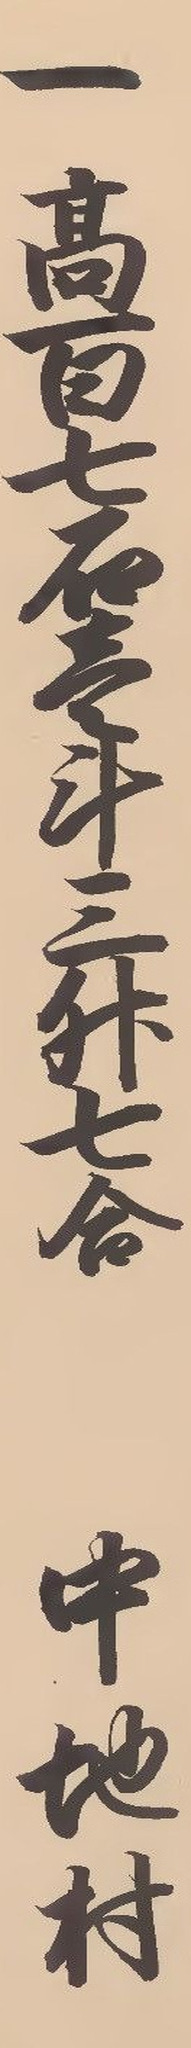一高百七石壱斗三升七合中地村
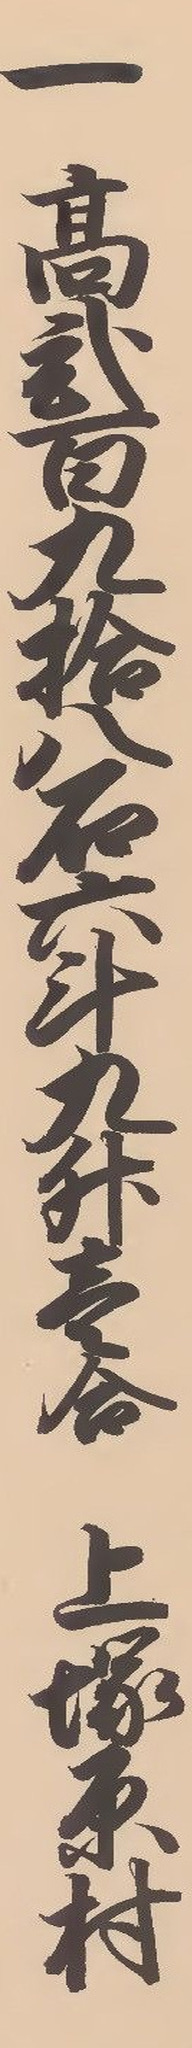一高弐百九拾八石六斗九升壱合上塚原村
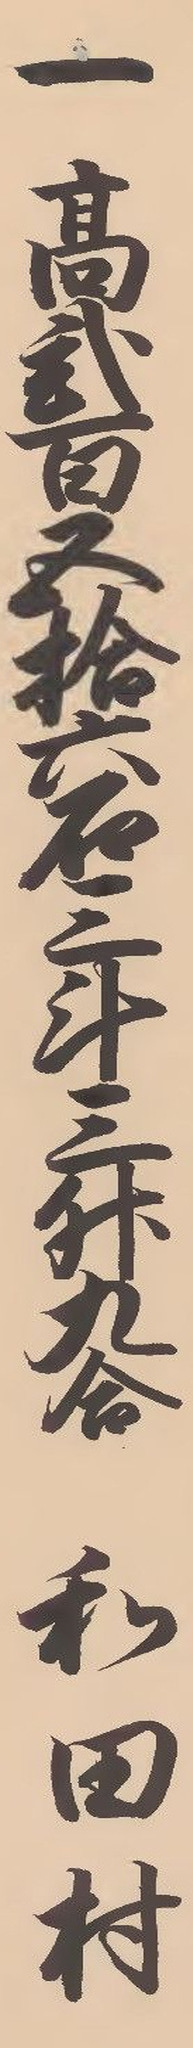一高弐百五拾六石三斗三升九合和田村
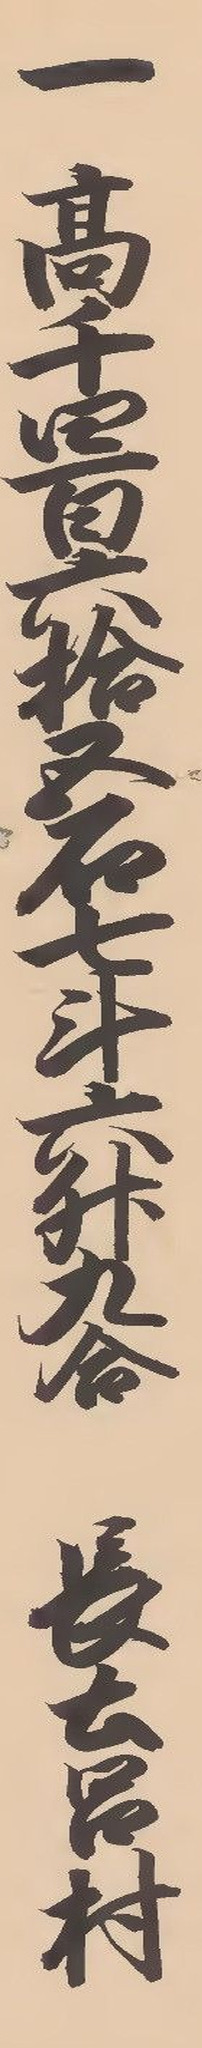一高千四百六拾五石七斗六升九合長土呂村

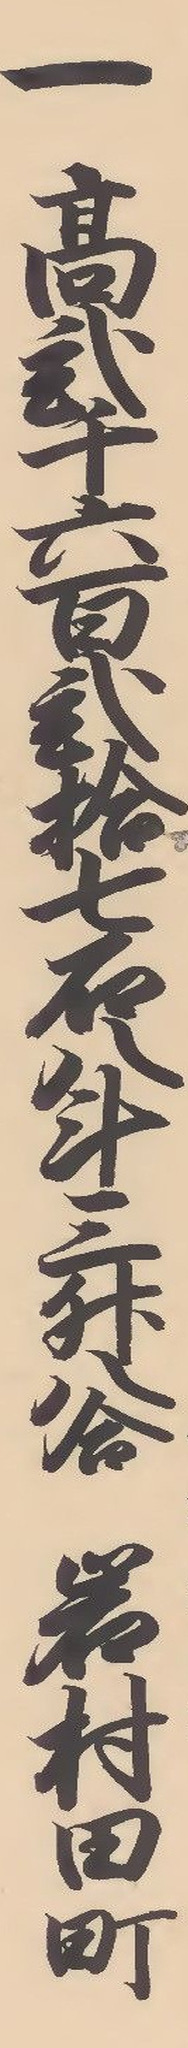一高弐千六百弐拾七石八斗三升八合岩村田町
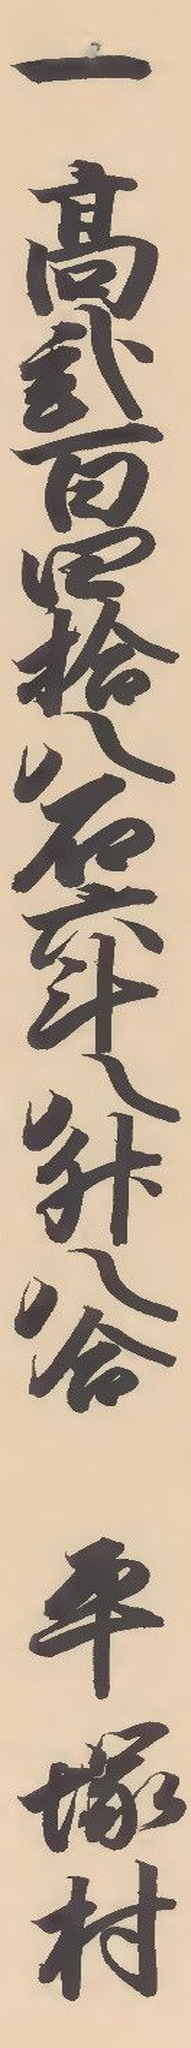一高弐百四拾八石六斗八升八合平塚村
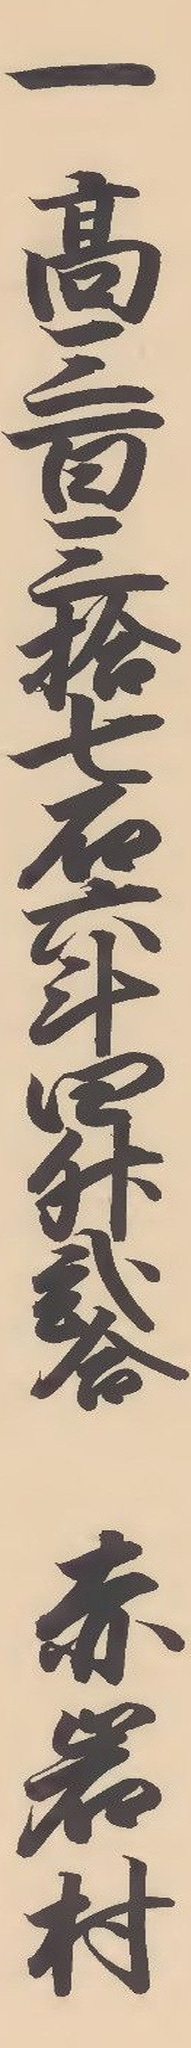一高三百三拾七石六斗四升弐合赤岩村
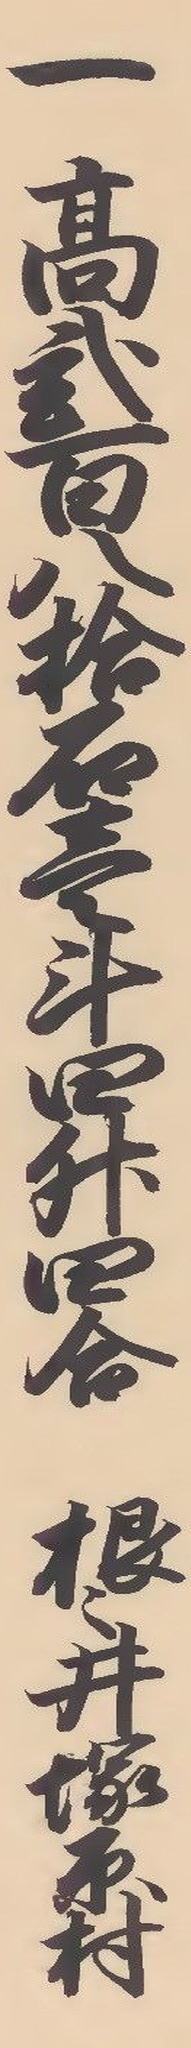一高弐百八拾石壱斗四升四合根井塚原村
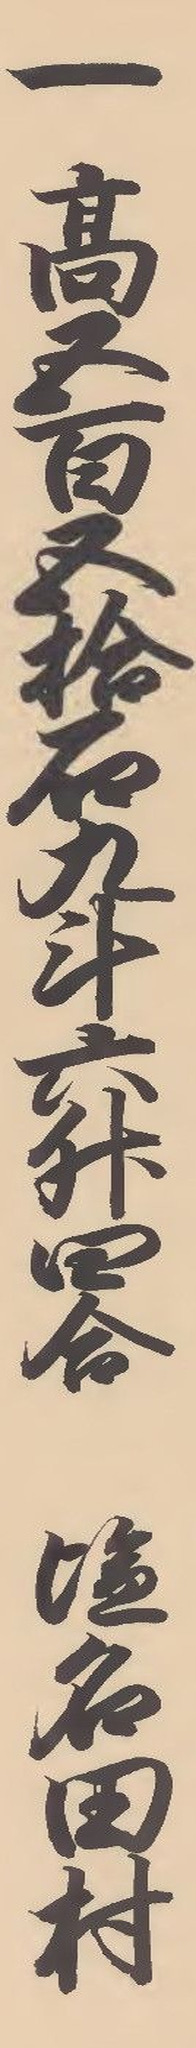一高五百五拾石九斗六升四合塩名田村
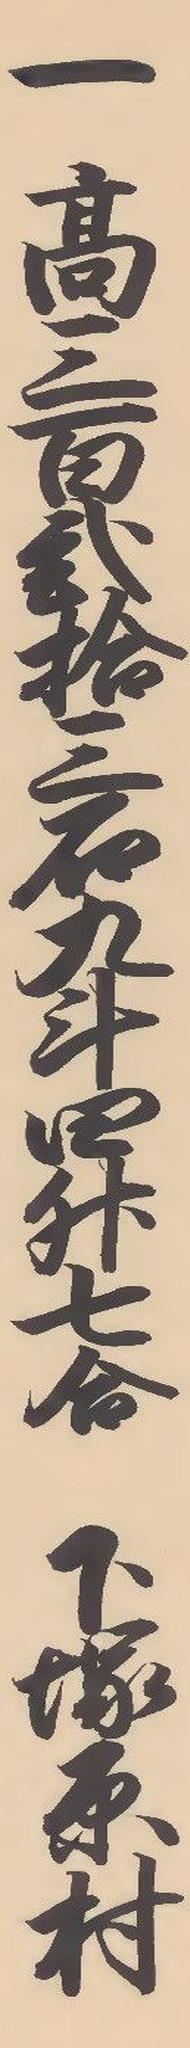一高三百弐拾三石九斗四升七合下塚原村
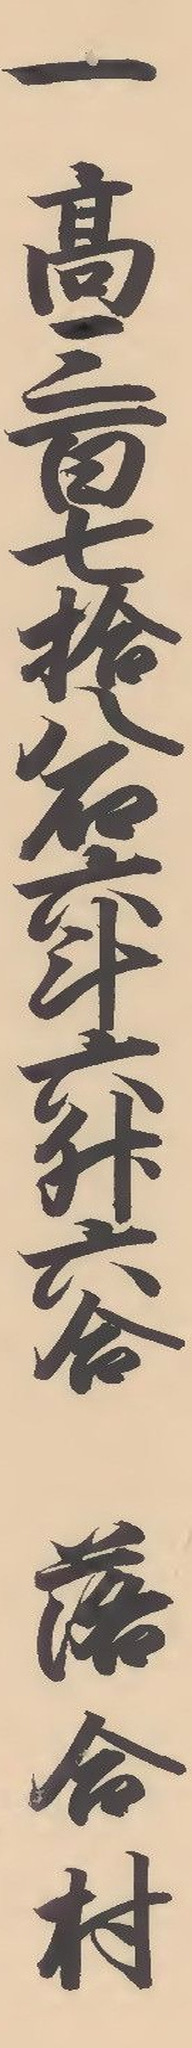一高三百七拾八石六斗六升六合落合村
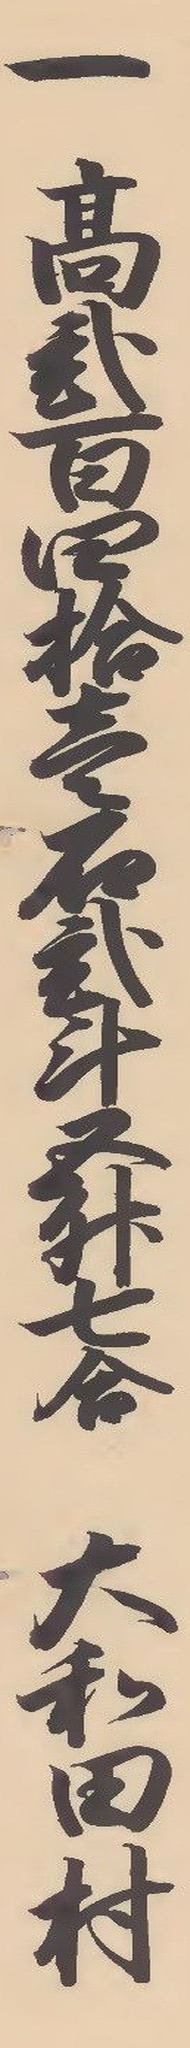一高弐百四拾壱石弐斗五升七合大和田村

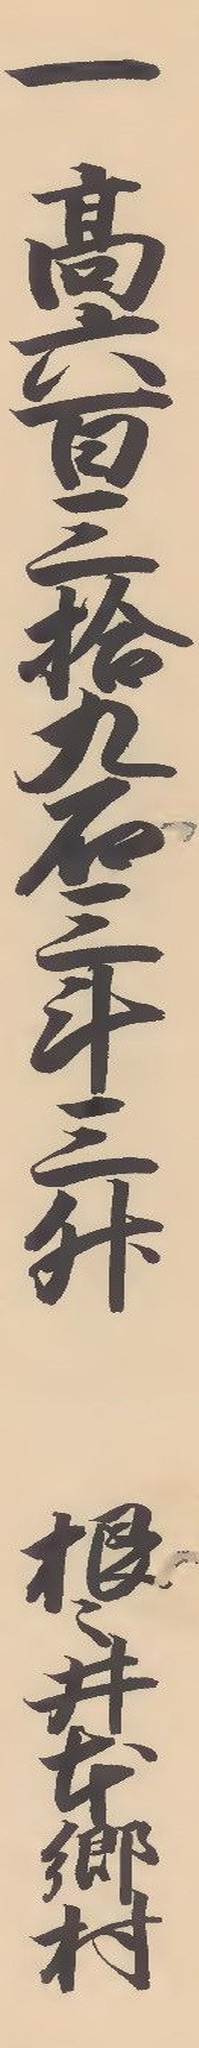一高六百三拾九石三斗三升根井本郷村
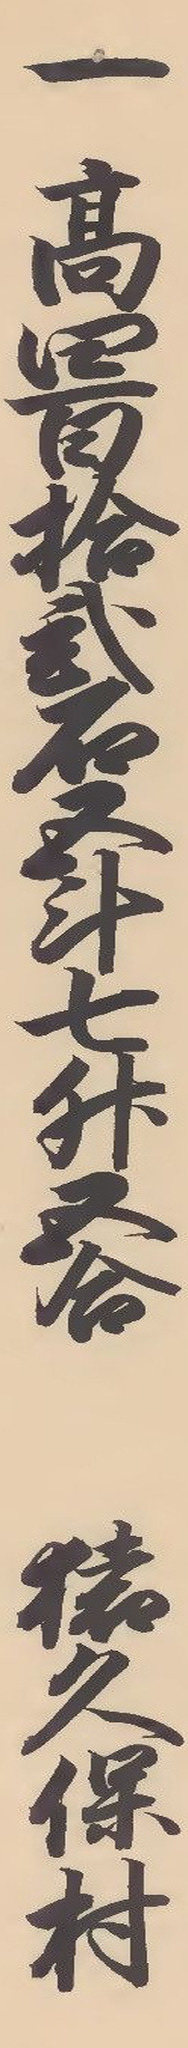一高四百拾弐石五斗七升五合猿久保村
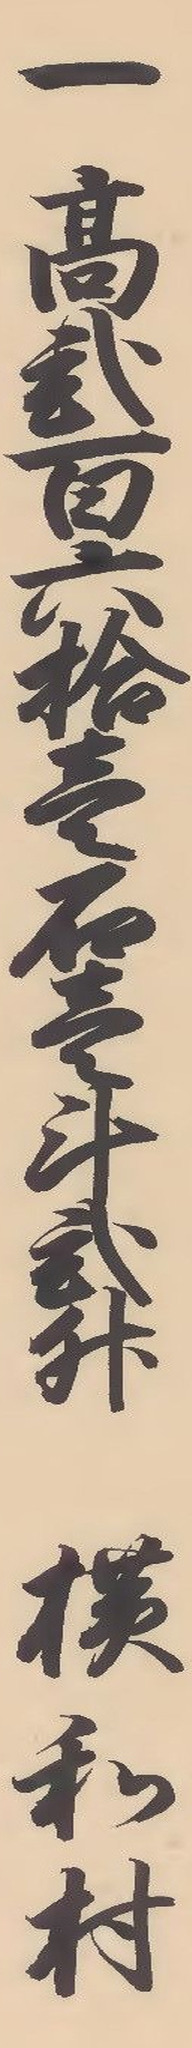一高弐百六拾壱石壱斗弐升横和村
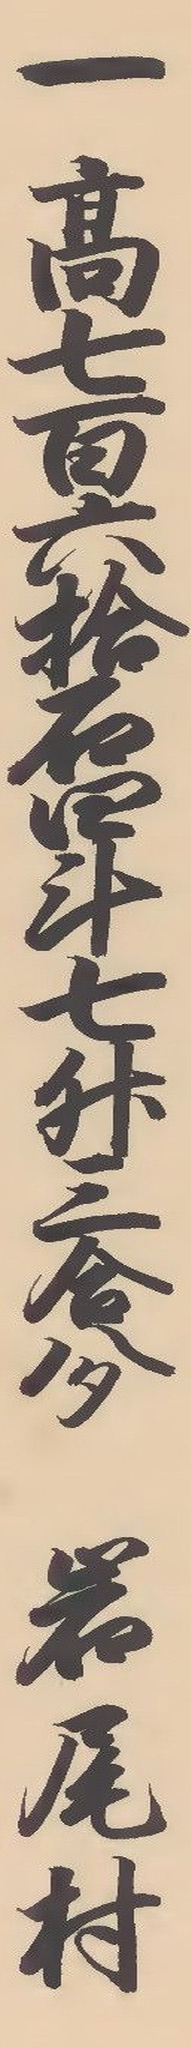一高七百六拾石四斗七升三合八勺岩尾村
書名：信濃国郷帳
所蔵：国立公文書館 National Archives of Japan
